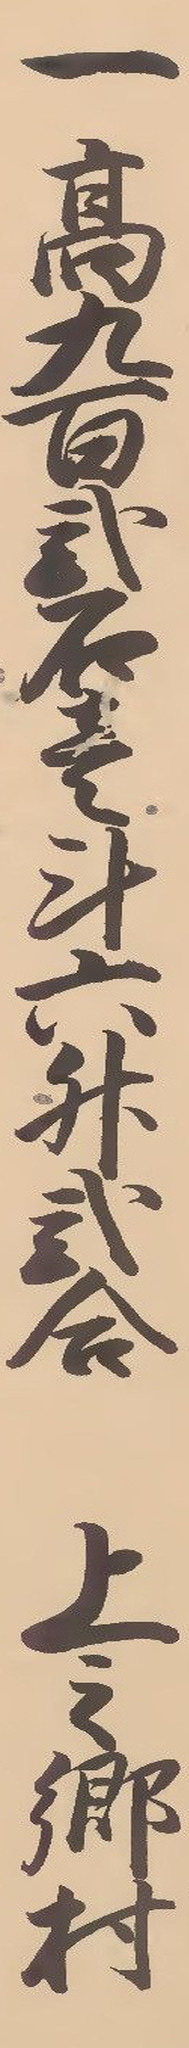一高九百弐石壱斗六升弐合上之郷村
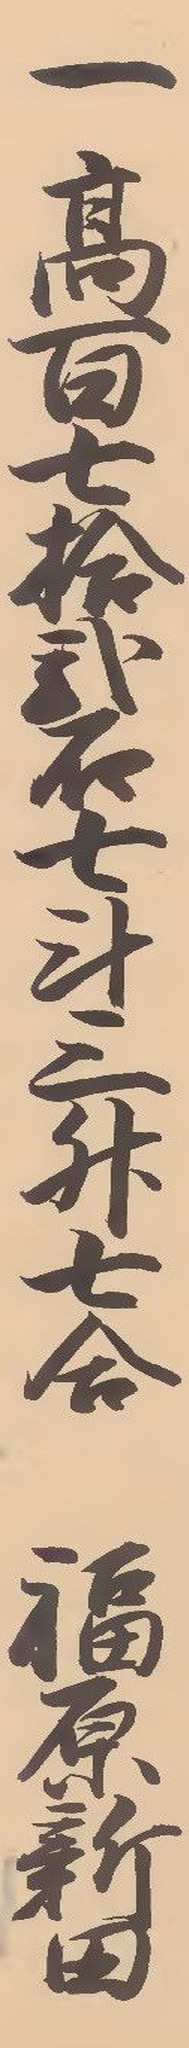一高百七拾弐石七斗三升七合福原新田
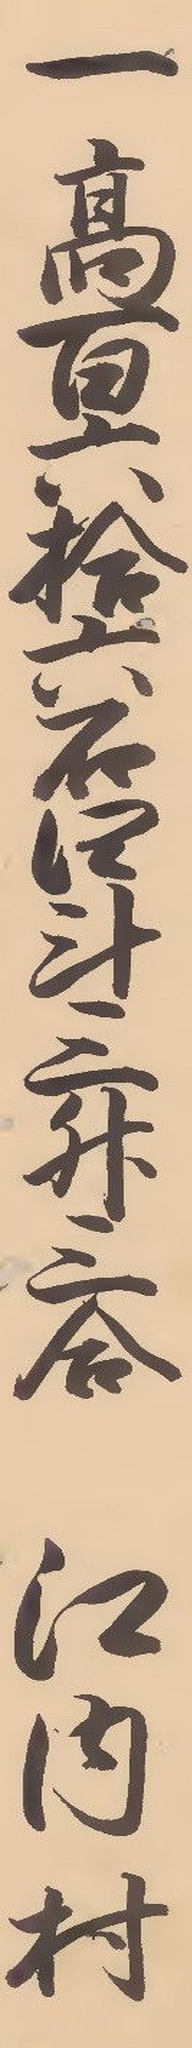一高百六拾六石四斗三升三合江内村

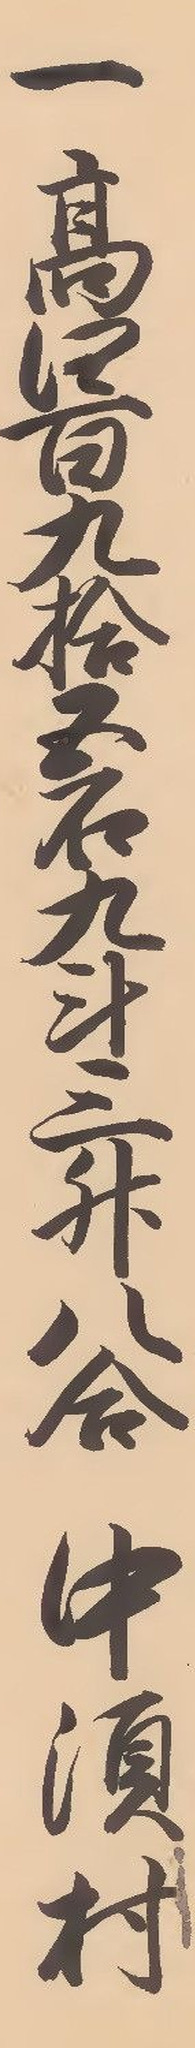一高四百九拾五石九斗三升八合中須村
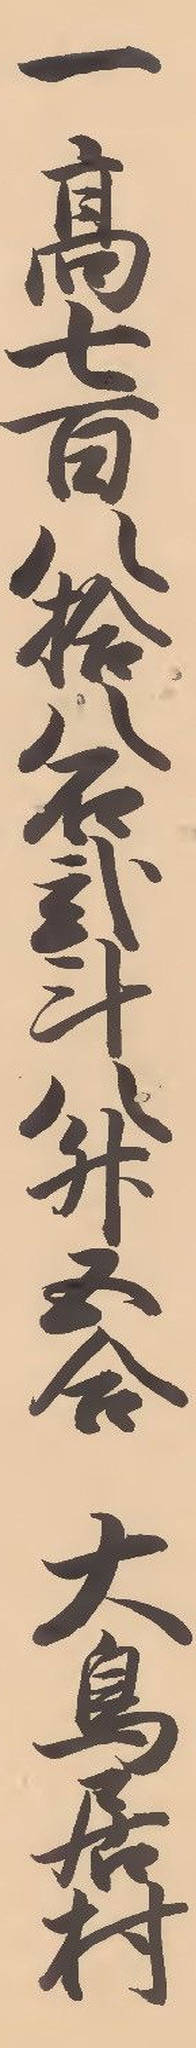一高七百八拾八石弐斗八升五合大鳥居村
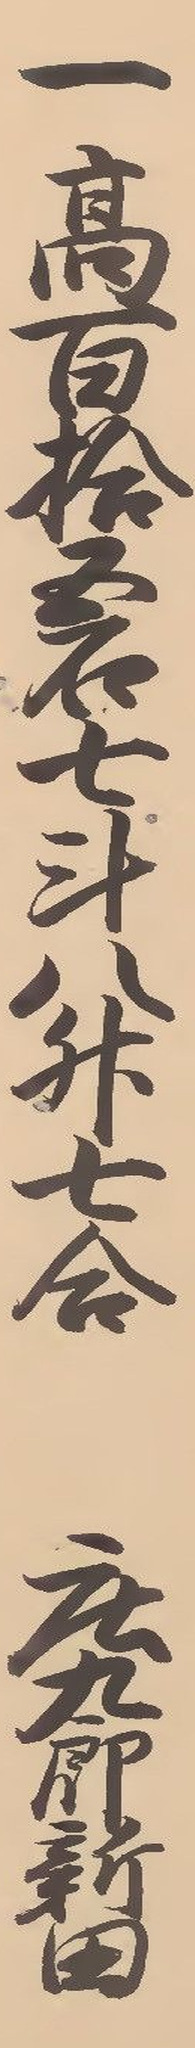一高百拾五石七斗八升七合庄九郎新田
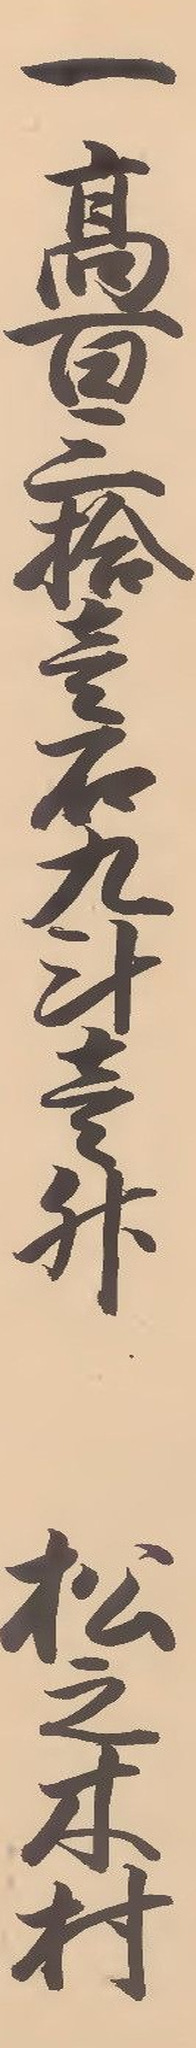一高百三拾壱石九斗壱升松之木村
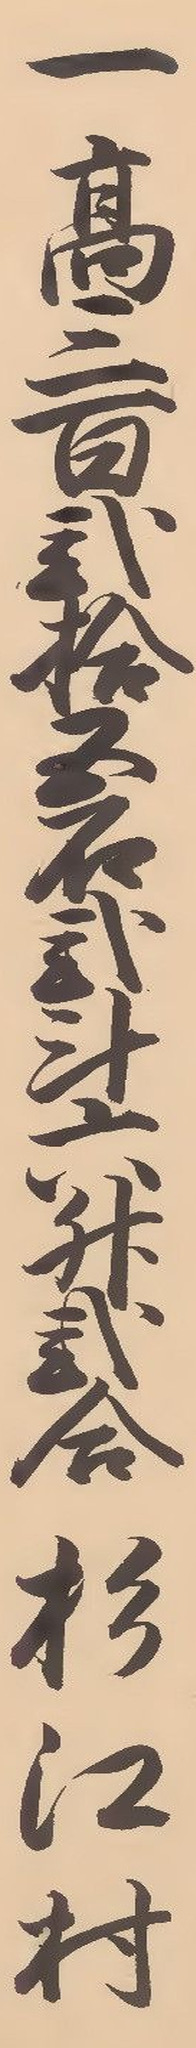一高三百弐拾五石弐斗六升弐合杉江村
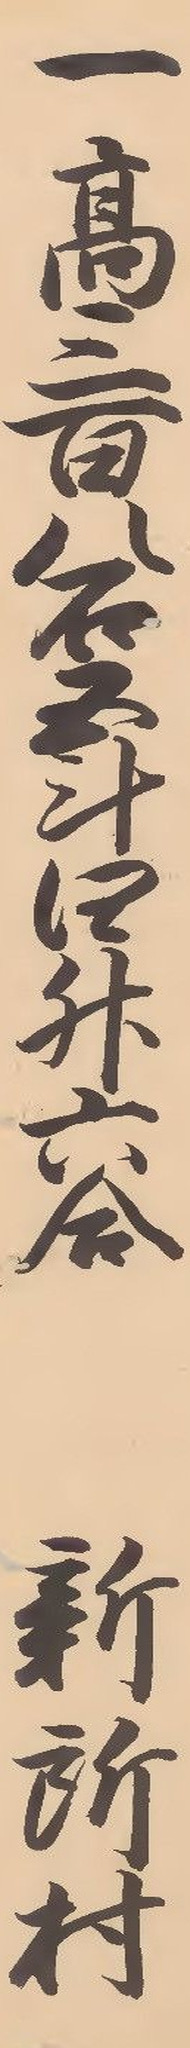一高三百八石五斗四升六合新所村

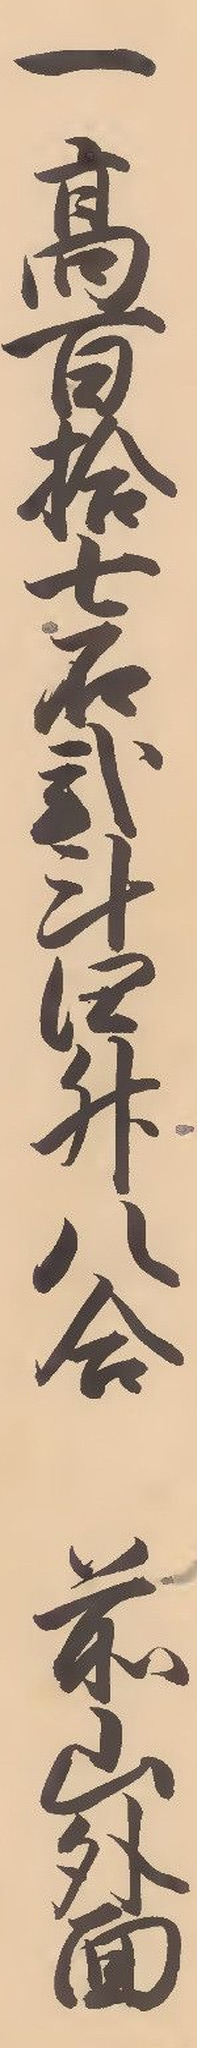一高百拾七石弐斗四升八合前山外面
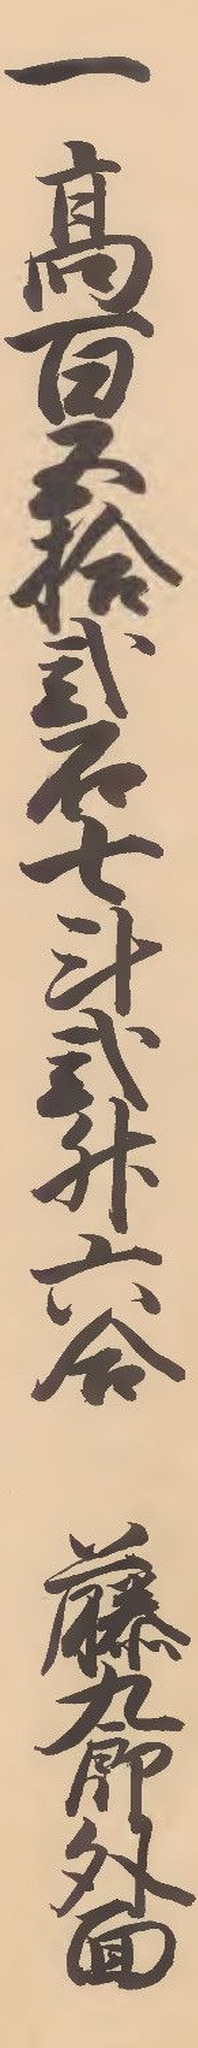一高百五拾弐石七斗弐升六合藤九郎外面
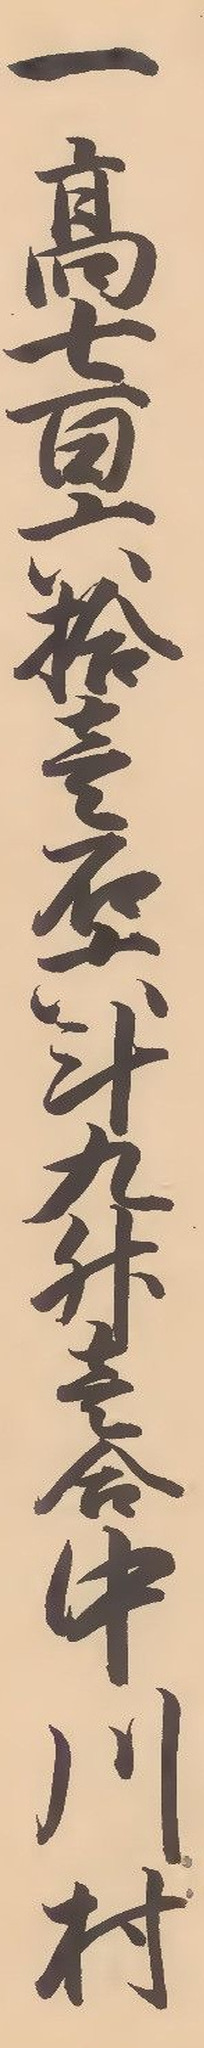一高七百六拾壱石六斗九升壱合中川村
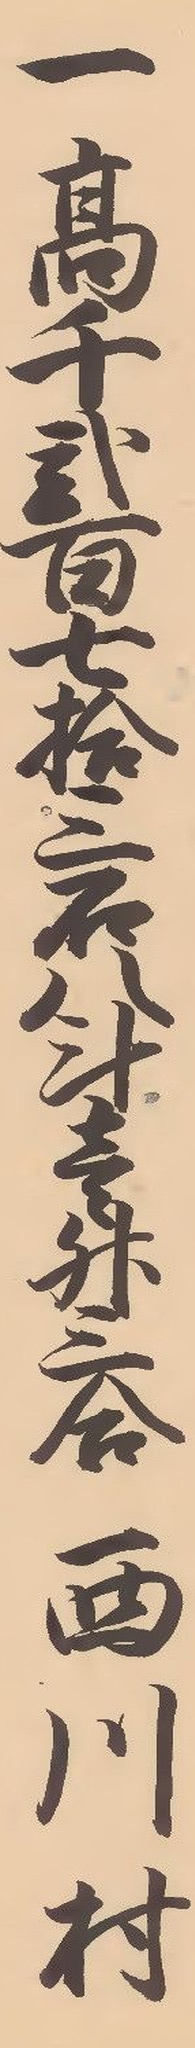一高千弐百七拾三石八斗壱升三合西川村
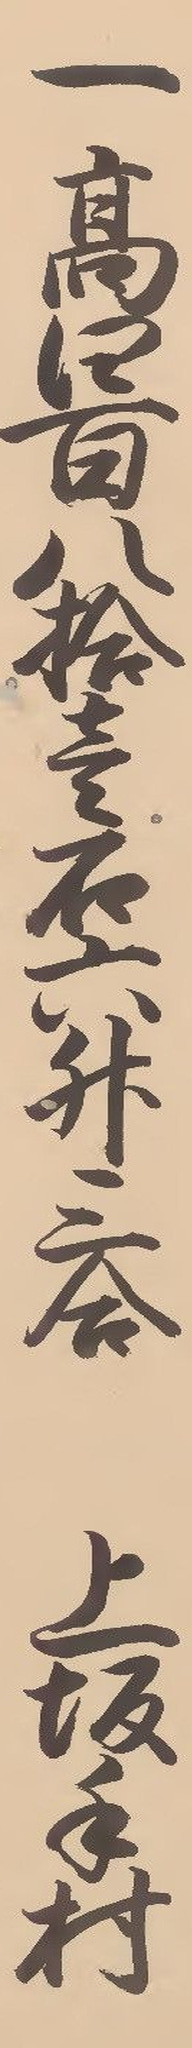一高四百八拾壱石六升三合上坂手村
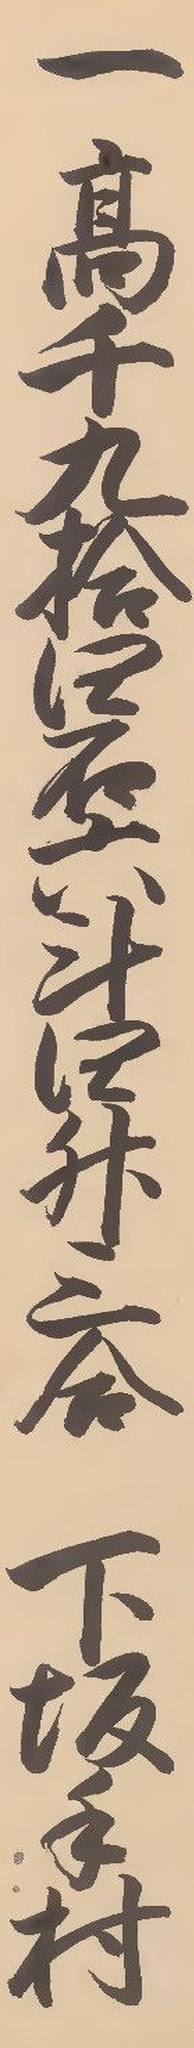一高千九拾四石六斗四升三合下坂手村
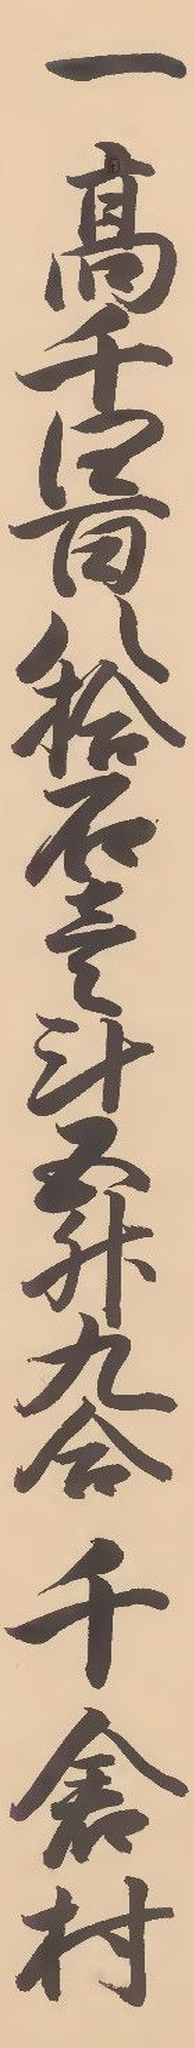一高千四百八拾石壱斗五升九合千倉村
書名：伊勢国郷帳
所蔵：国立公文書館 National Archives of Japan
